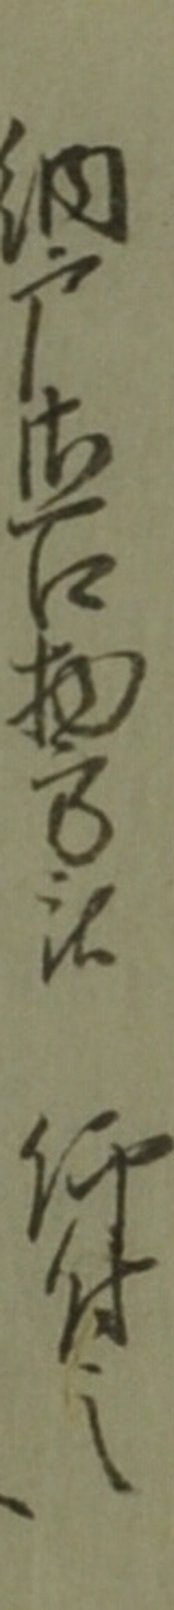納戸御召物方被仰付之
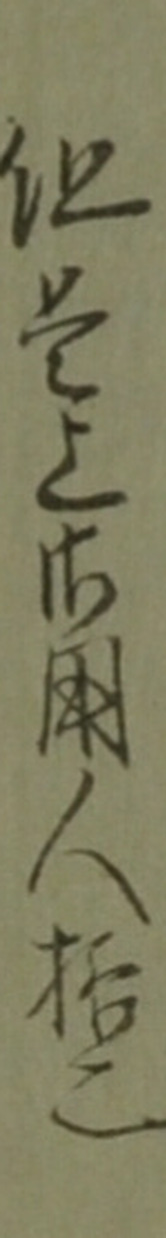但是迄御用人格也
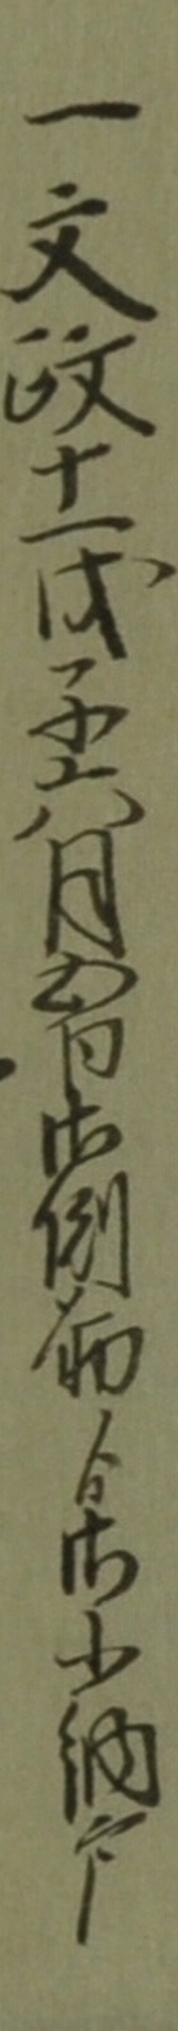一文政十一戊子六月五日御側勤ゟ御小納戸
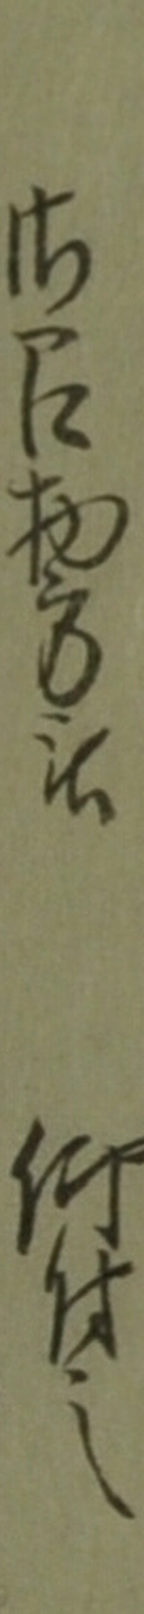御召物方被仰付之
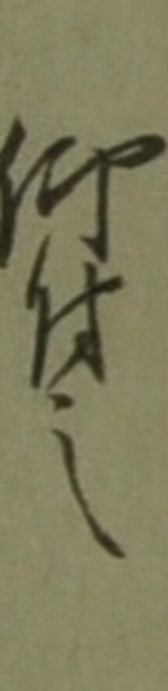仰付之
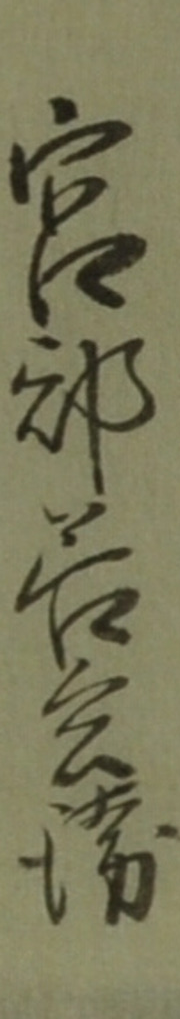宮部善兵衛
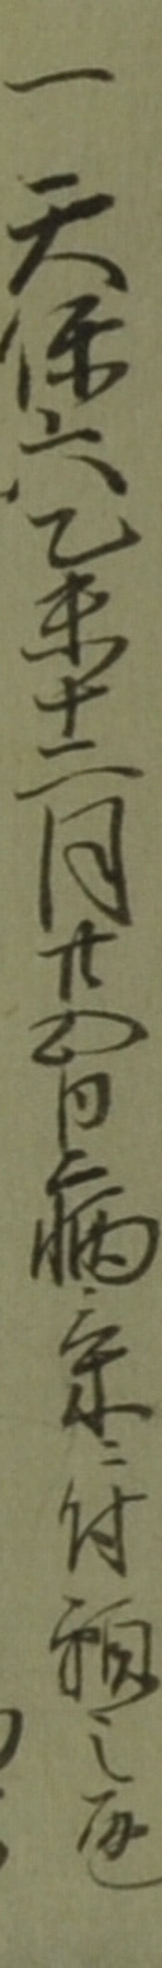一天保六乙未十二月廿五日病気ニ付願之通
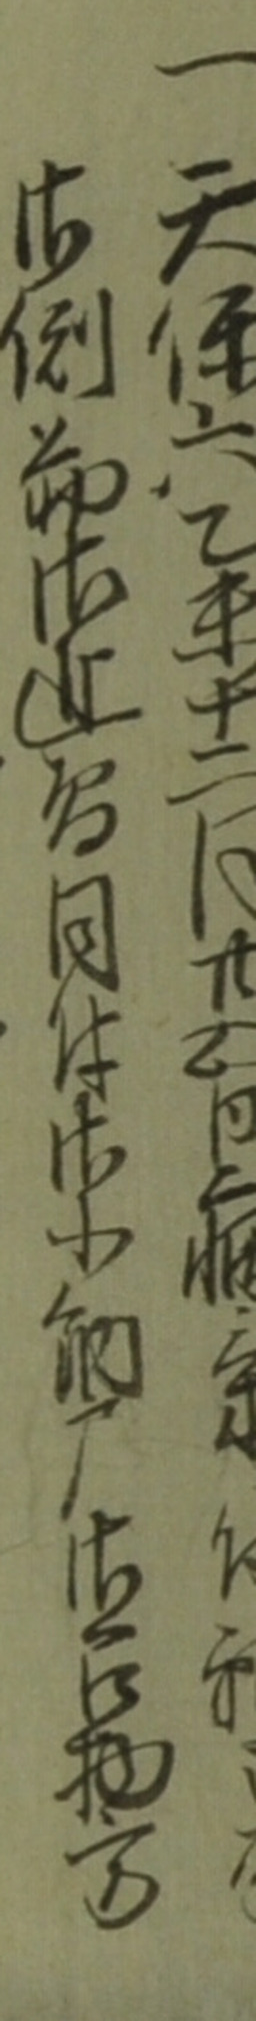御側勤御近習目付御小納戸御召物方
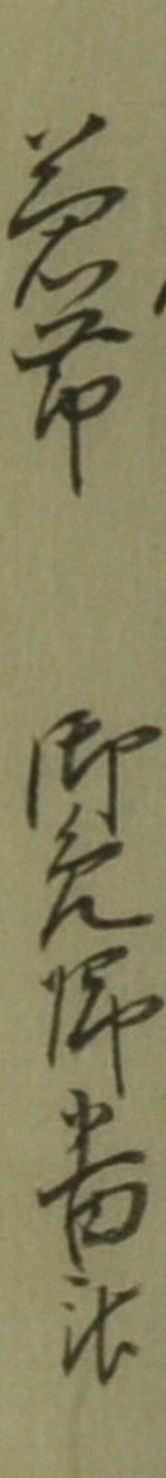兼帯御免御番被

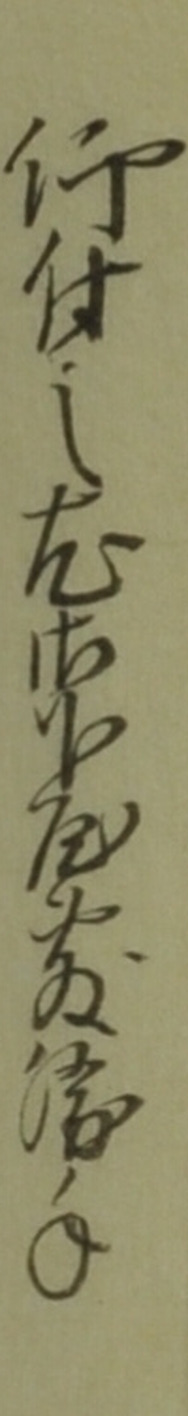御仰付之尤御下屋敷勝手
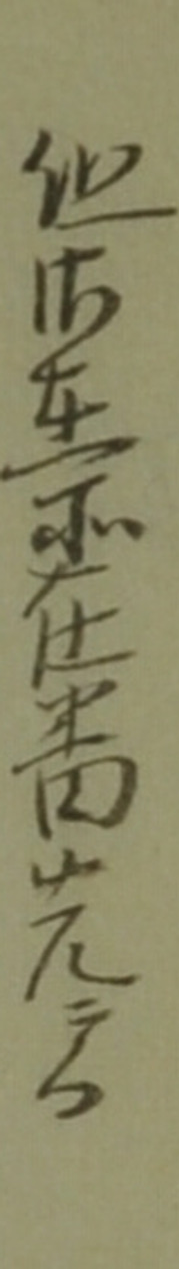但御在所在番先ニ而
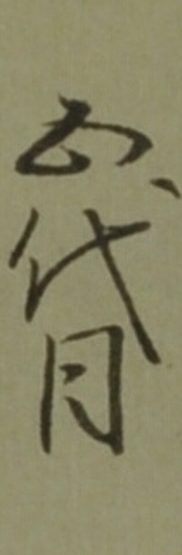五代目
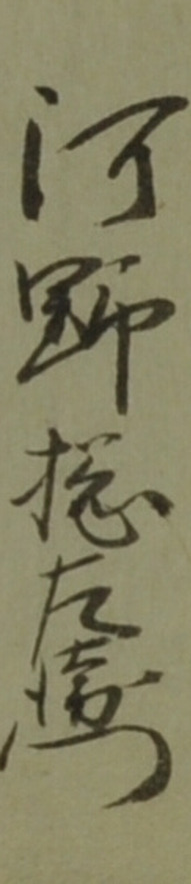河野捴左衛門
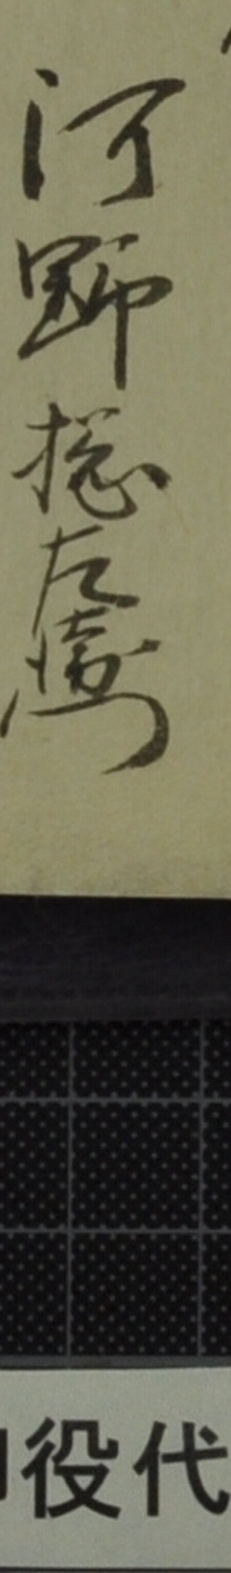河野捴左衛門
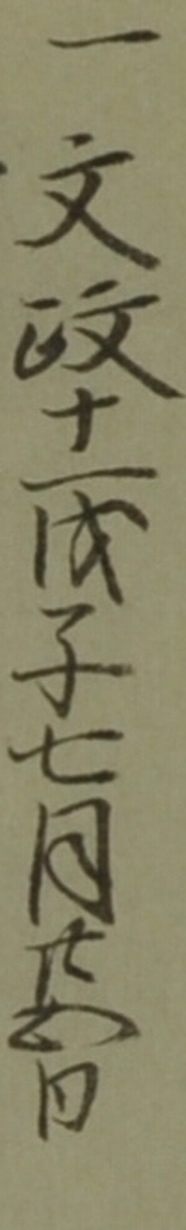一文政十一戊子七月廿五日
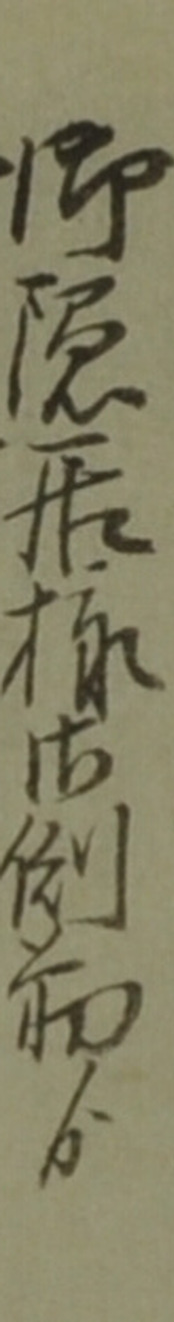御隠居様御側勤ゟ
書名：諸御役代々録（四）
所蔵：伊那市立高遠町図書館・合同会社AMANE
